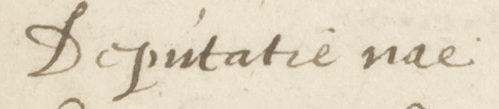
Deputatie nae
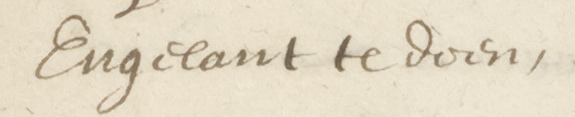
Engelant te doen.
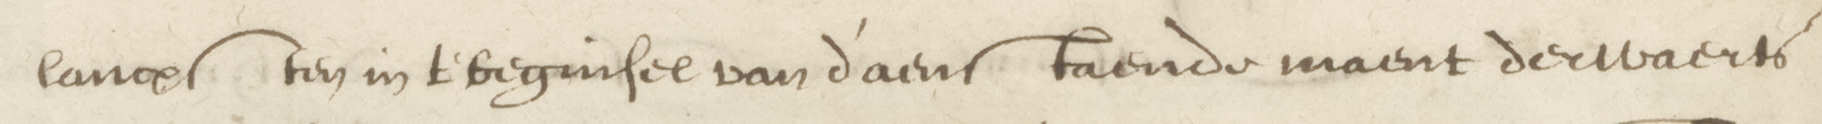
lancxsten in t' beginsel van d'aenstaende maent derwaerts
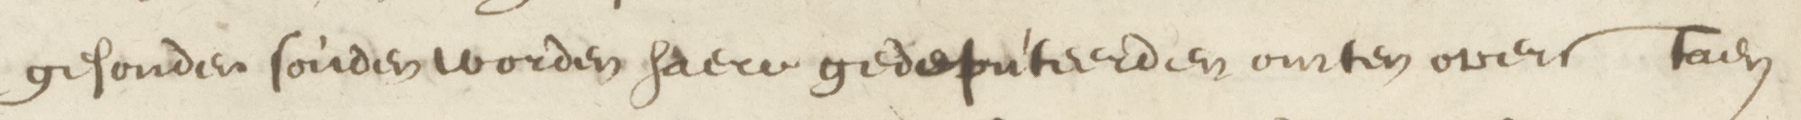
gesonden souden worden haere gedeputeerden om ten overstaen,
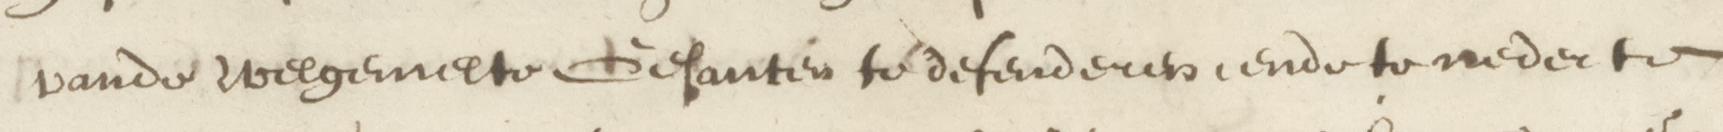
vande welgemelte Gesanten te defenderen, ende te neder te
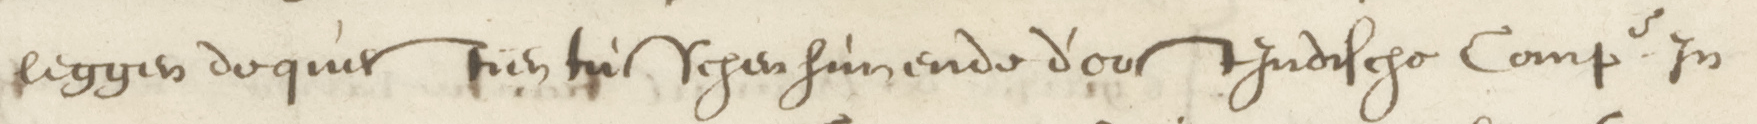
leggen de questien tusschen hun ende d'oostIndische Compe. in
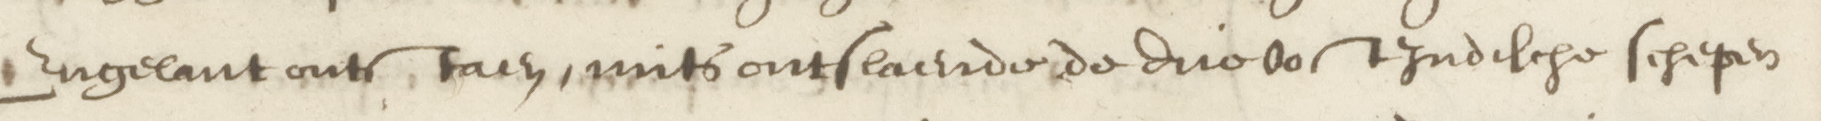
Engelant ontstaen, mits ontslaende de drie oostIndische schepen
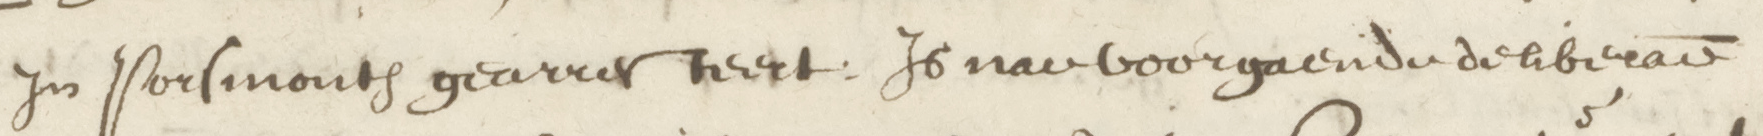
in Porsmouth gearresteert. Is nae voorgaende deliberae
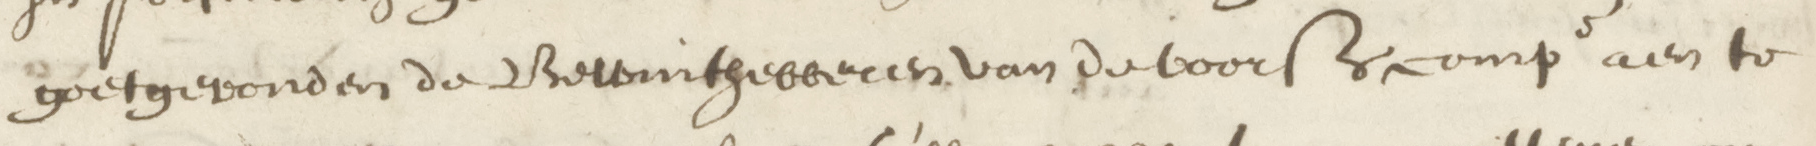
goetgevonden de Bewinthebberen van de voors compe aen te
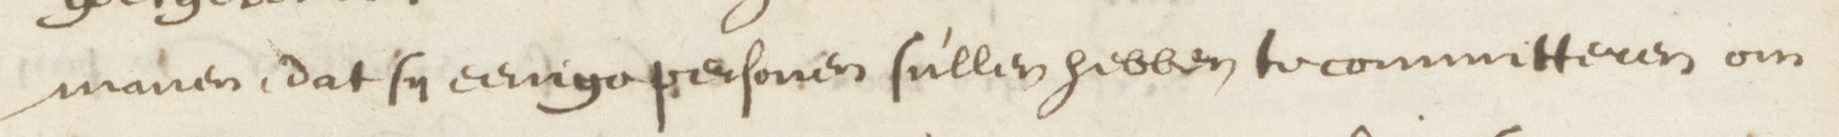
manen, dat sy eenige personen sullen hebben te committeren om
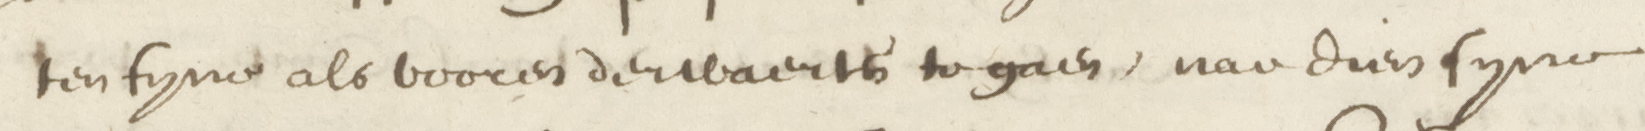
ten fyne als vooren derwaerts te gaen, nae dien syne
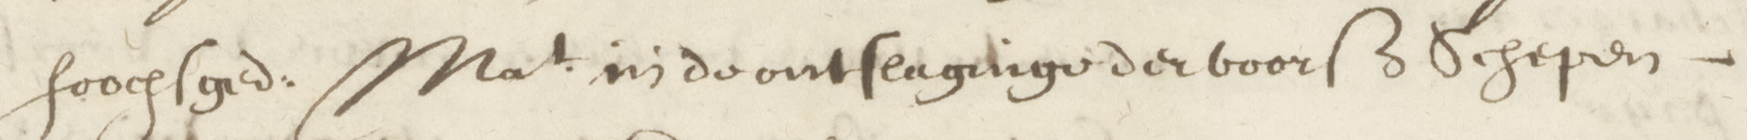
hoochsged: Mat. in de ontslaginge der voors Schepen -
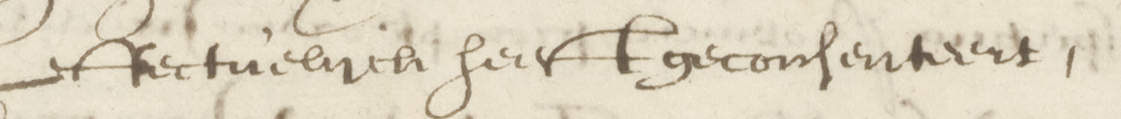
effectuelyck heeft geconsenteert.
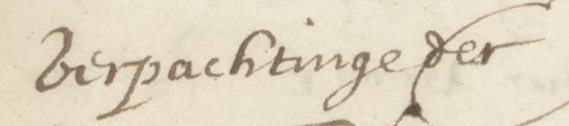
verpachtinge der
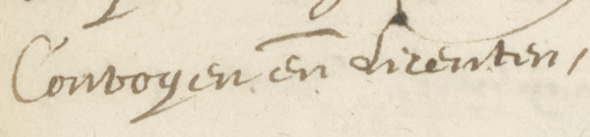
Convoyen en Licenten.
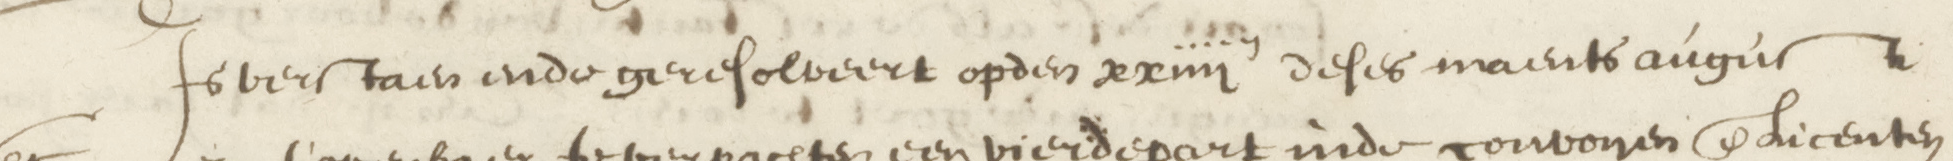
Is verstaen ende geresolveert opden xxiiijen deses maents augusti
